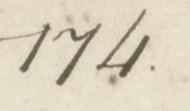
174.
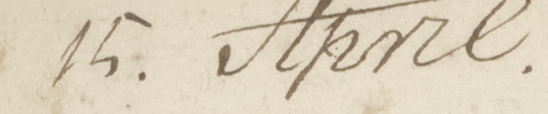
15. April.
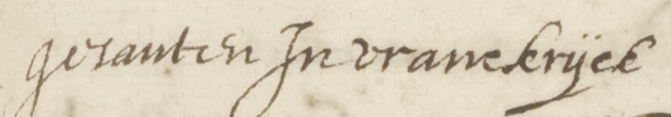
gesanten In vranckrijck
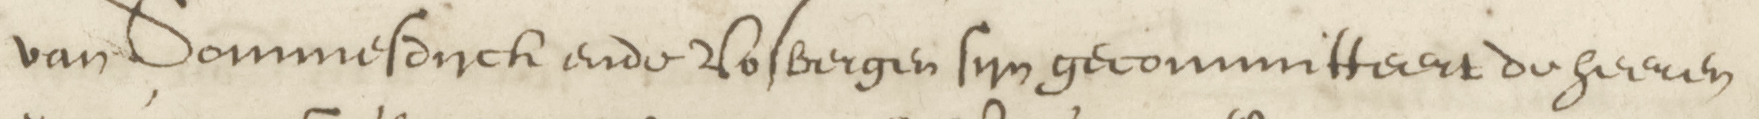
van Sommesdyck ende Vosbergen syn gecommitteert de heeren
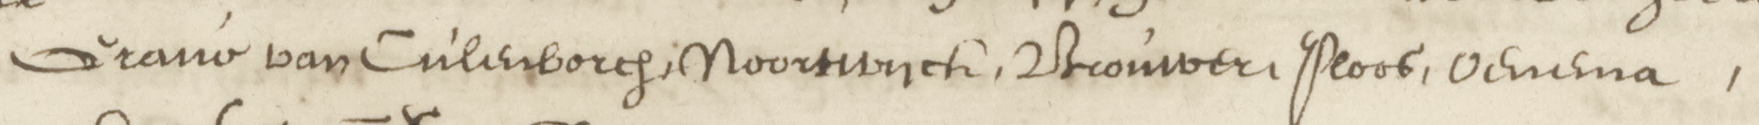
Graue van Culenborch, Noortwijck, Brouwer, Ploos, Oemena,
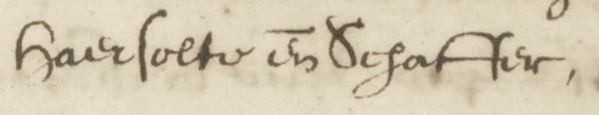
haersolte en Schafter,
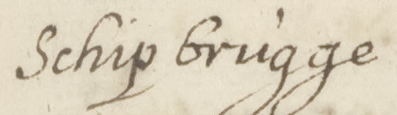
Schip brugge
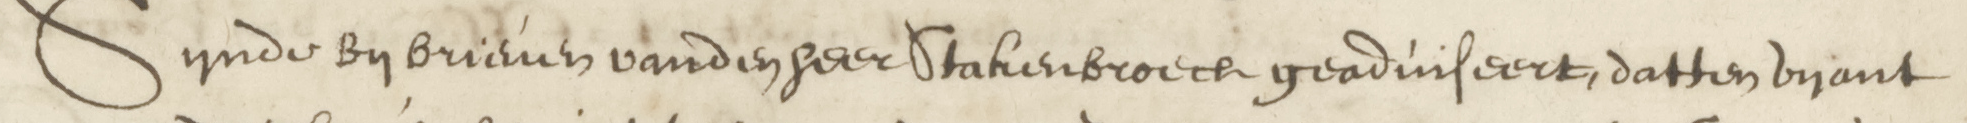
Synde bij brieuen vanden heer Stakenbroeck geaduiseert, datten vyant
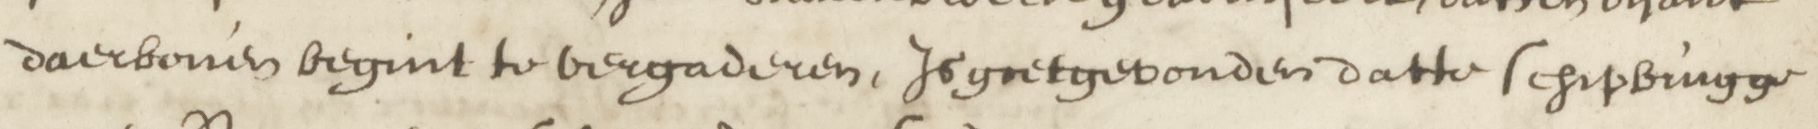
daerbouen begint te vergaderen, Is goetgevonden datte schipbrugge
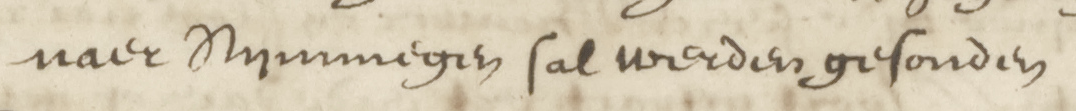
naer Nymmegen sal werden gesonden
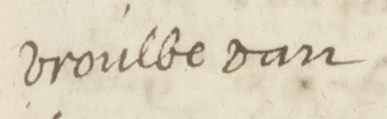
vrouwe van
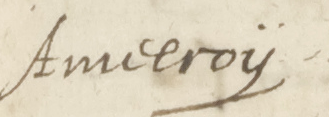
Amelroij.
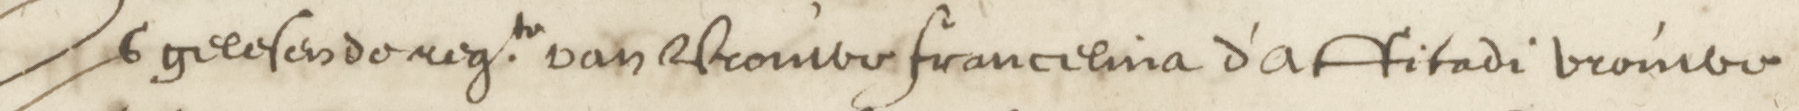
Is gelesen de reqte. van Vrouwe francelina d'Affitadi vrouwe
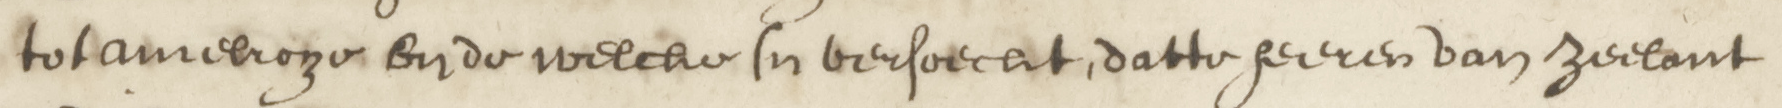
tot Amelroye by de welcke sy versoeckt, datte heeren van Zeelant
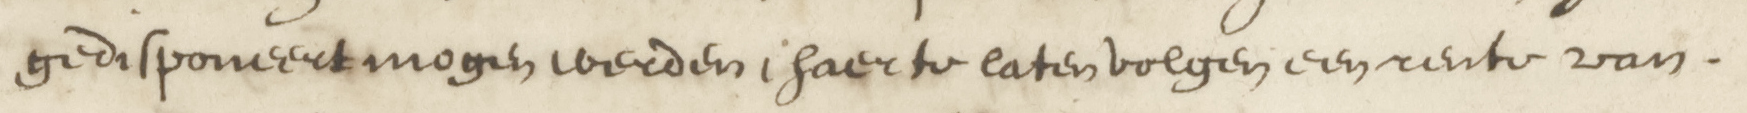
gedisponeert mogen werden, haer te laten volgen een rente van -
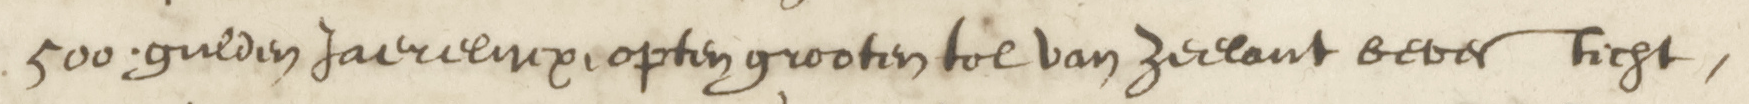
500. gulden Jaerelycx, opten grooten tol van Zeelant bevesticht.
